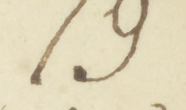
79
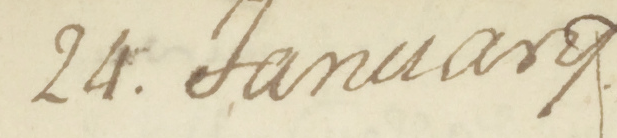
24. Januarij
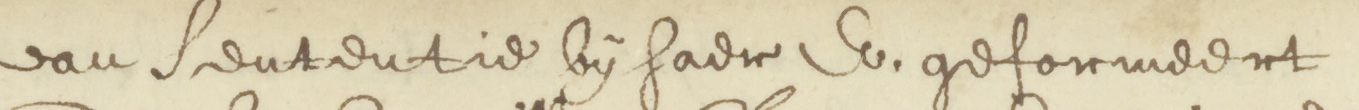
van sententie bij haer E. geformeert
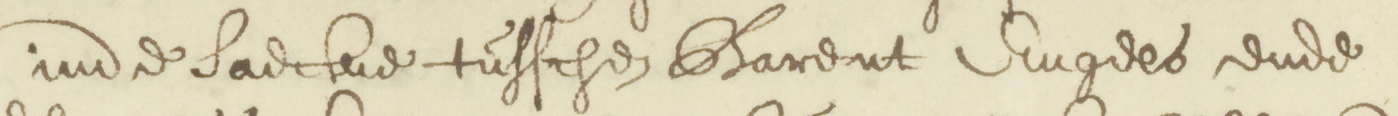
inde saecke tusschen Barent Engels ende
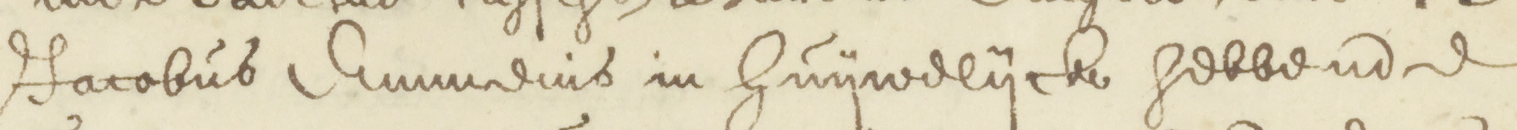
Jacobus Emmenis in huijwelijck hebbende
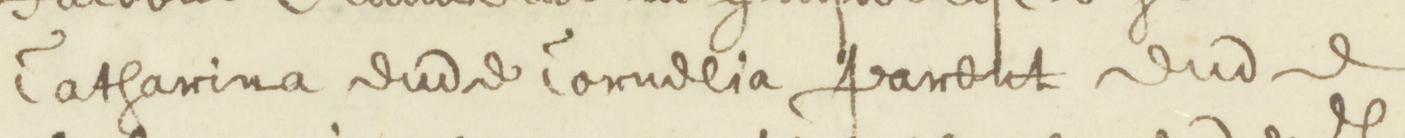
Catharina ende Cornelia Parent ende
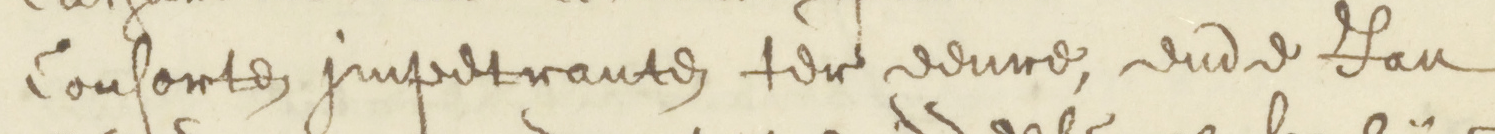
consorten impetranten ter eenre ende Jan
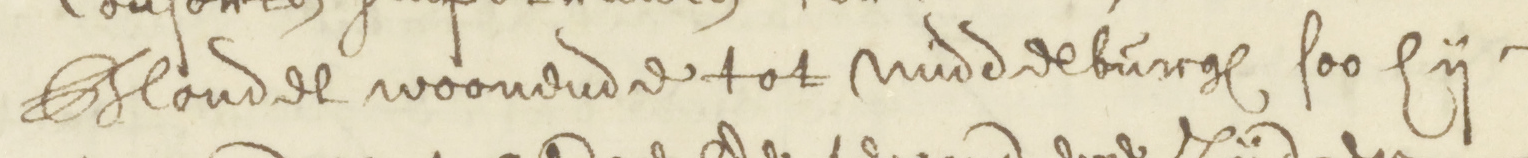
Blondel woonende tot Middelburgh soo hij
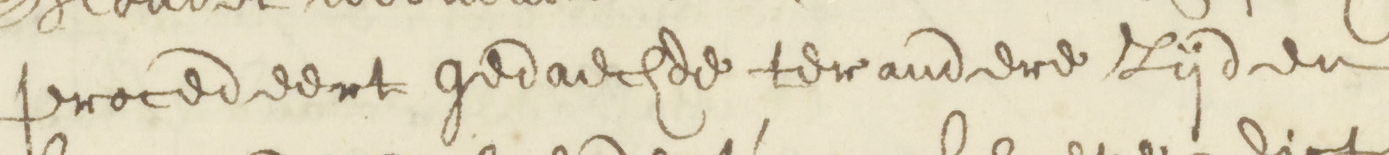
procedeert gedaechde ter andere zijden
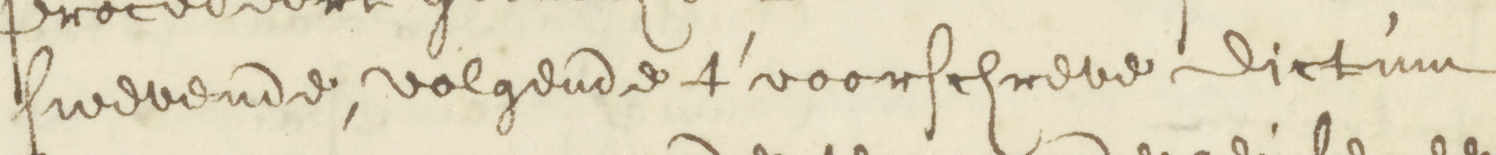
swevende, volgende t'voorschreve Dictum
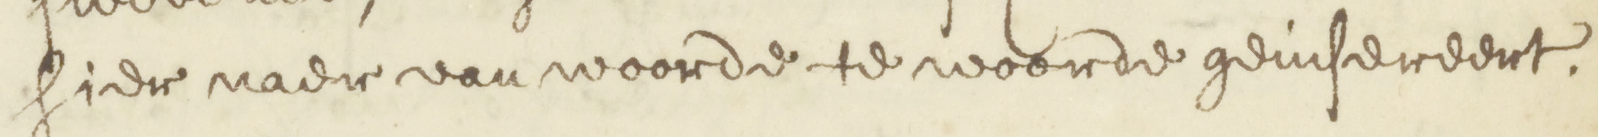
hier naer van woorde te woorde geinsereert.
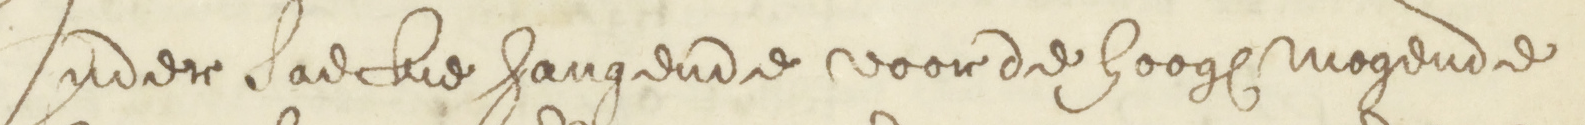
Inder saecke hangende voor de Hoogh mogende
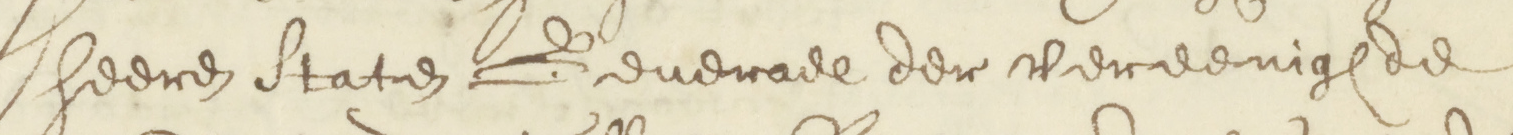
heeren Staten Generael der Vereenighde
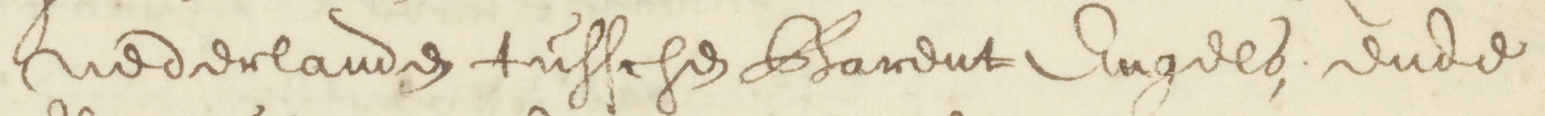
Nederlanden tusschen Barent Engels, ende
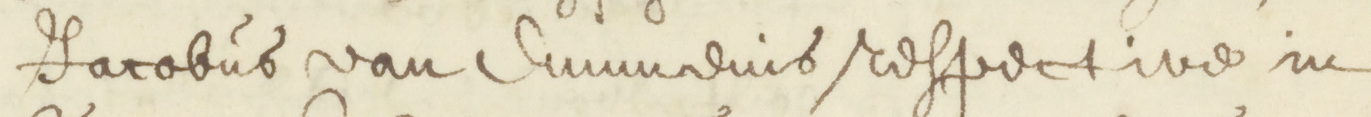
Jacobus van Emmenis respective in
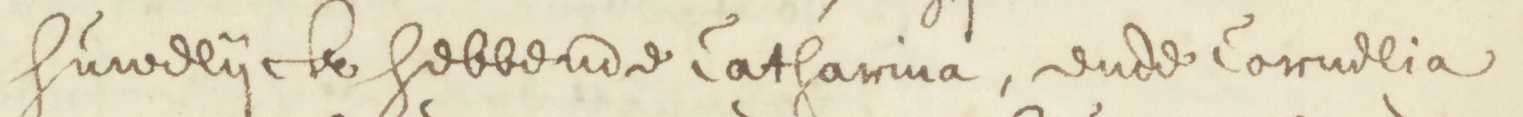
huwelijck hebbende Catharina, ende Cornelia
